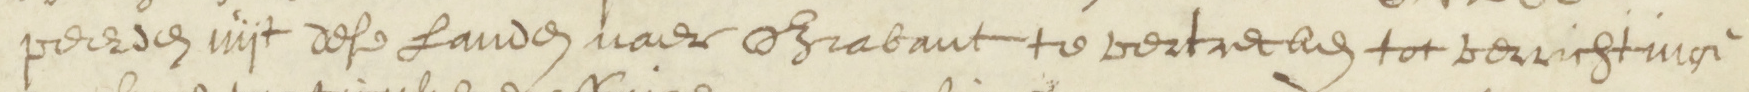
peerden uijt dese Landen naer Brabant te vertrecken tot verrichtinge
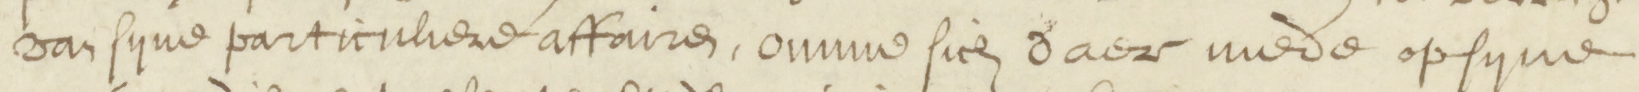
van syne particuliere affairen, omme sich daer mede op syne
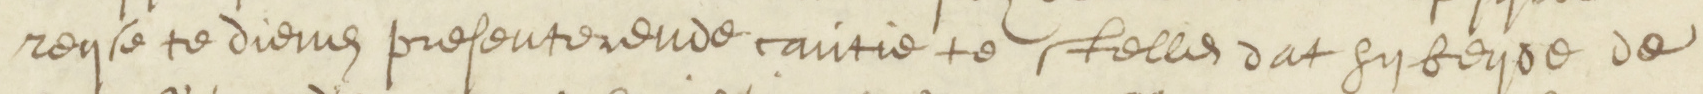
reyse te dienen presenterende cautie te stellen dat hy beyde de
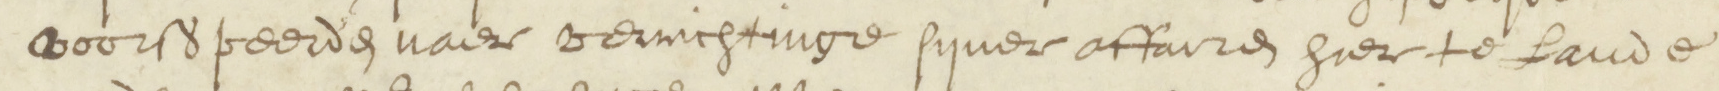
voors peerden naer verrichtinge syner affairen hier te Lande
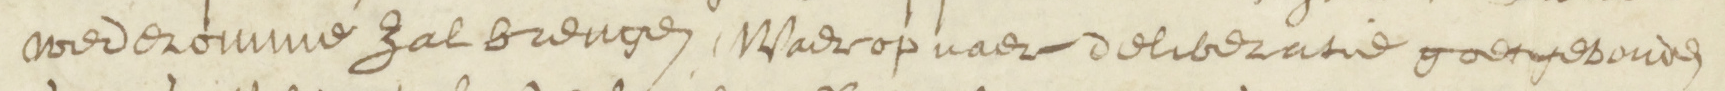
wederomme zal brengen, Waerop naer deliberatie goetgevonden
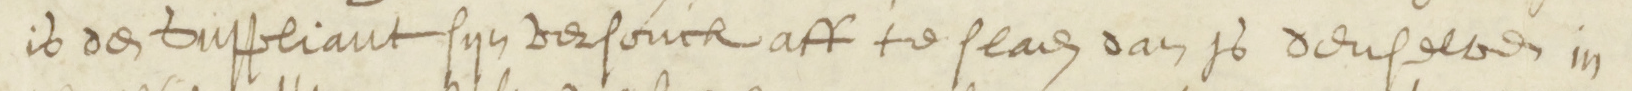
is den Suppliant syn versouck aff te slaen dan is denselven in
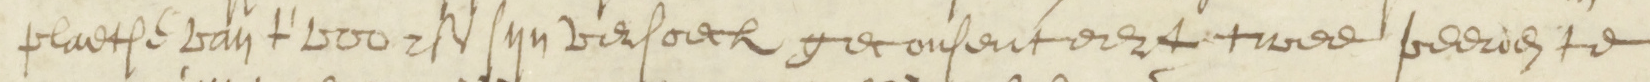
plaetse van t‛ voors syn versoeck geconsenteert twee peerden te
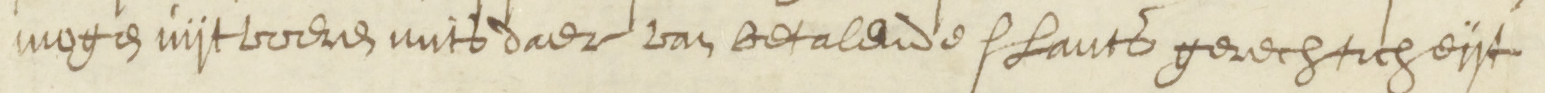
mogen uijtvoeren mits daer van betalende sLants gerechticheijt.
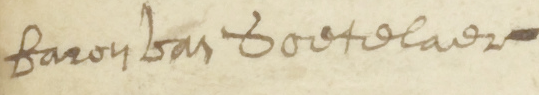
baron van Soetelaer
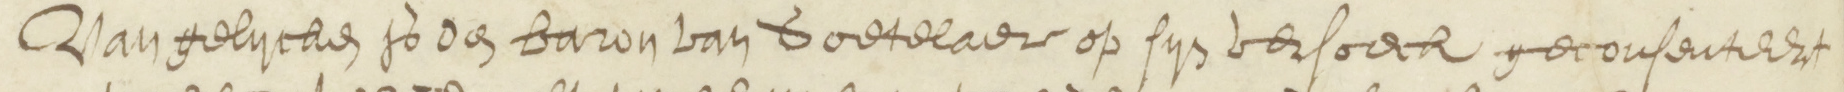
Van gelycken is den baron van Soetelaer op syn versoeck geconsenteert
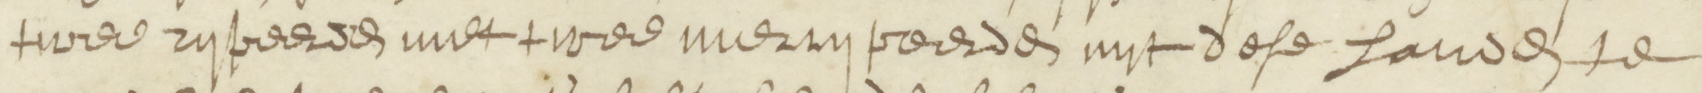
twee rypeerden met twee merrypeerden uyt dese Landen te
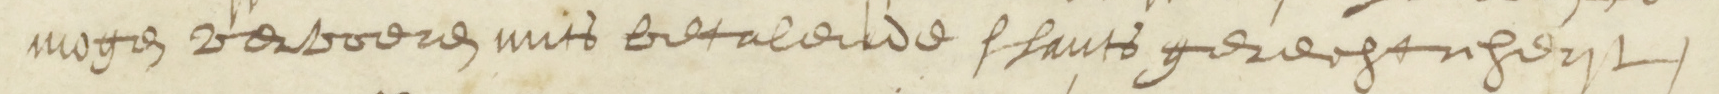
mogen vervoeren mits betalende sLants gerechticheyt.
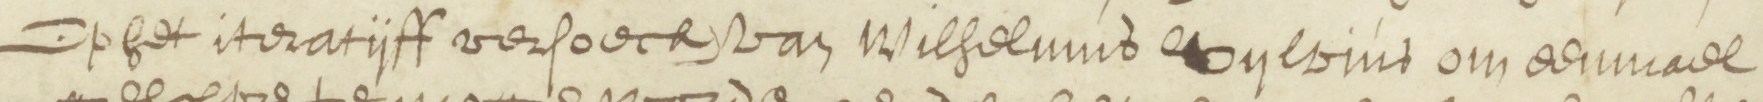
Op het iteratijff versoeck van Wilhelmus Sylvius om eenmael
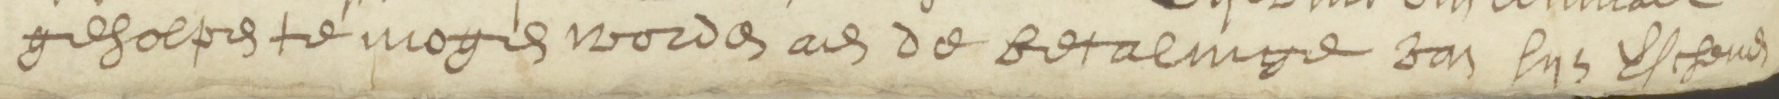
geholpen te mogen worden aen de betalinge van syn vschenen
